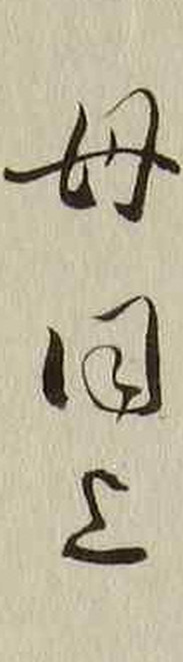母同上
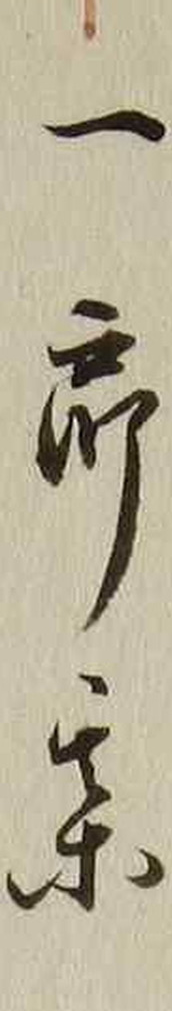一郎某
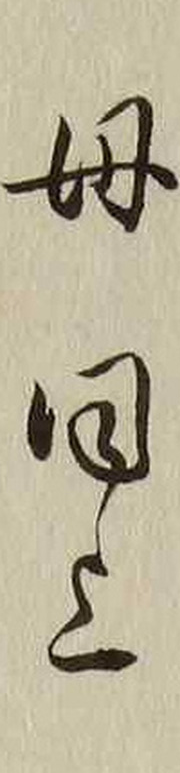母同上
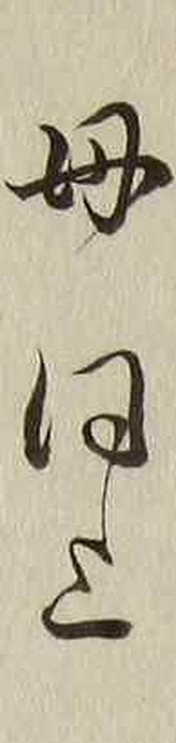母同上
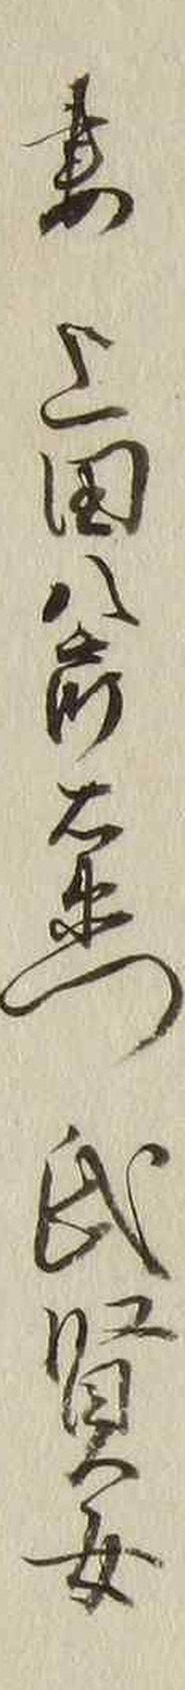妻上田八郎右衛門氏賢女
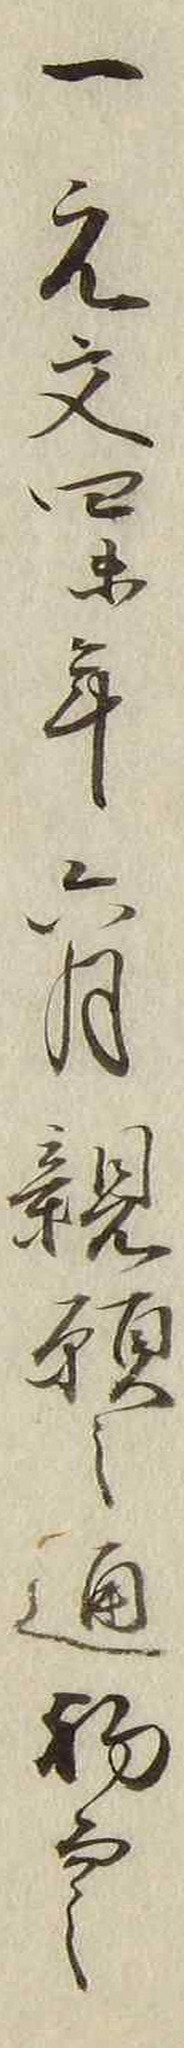一元文四未年六月親願之通初而之
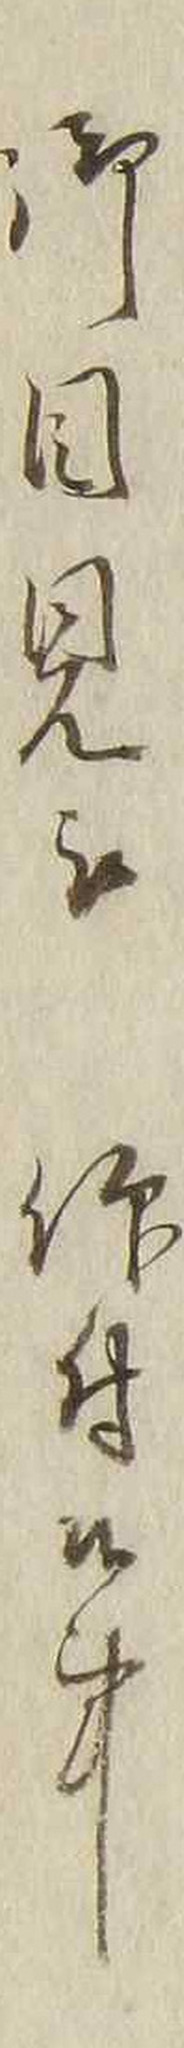御目見被仰付候事

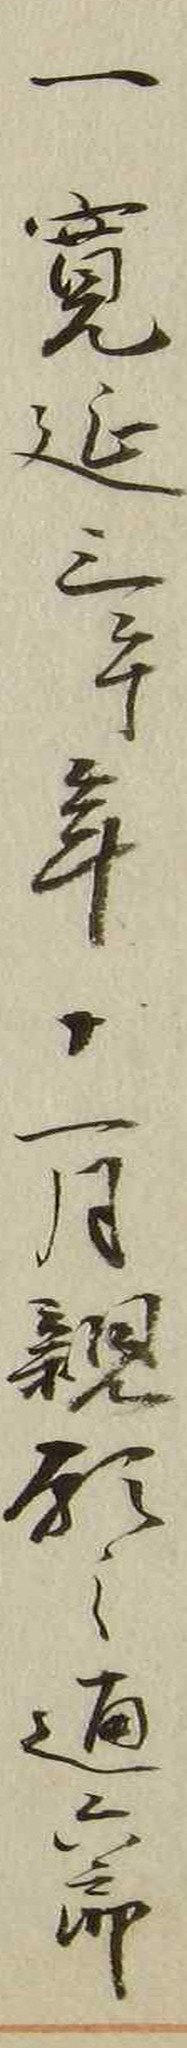一寛延三午年十一月親願之通六郎
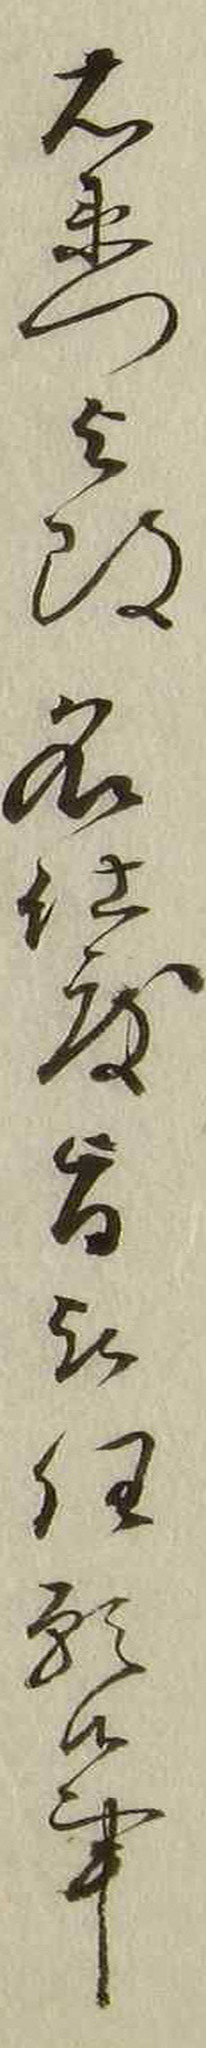右衛門与改名仕度旨被任願候事
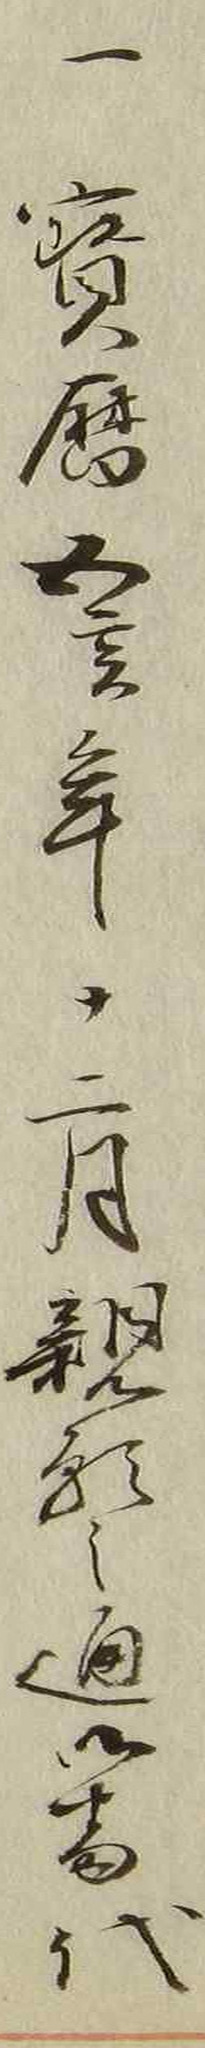一宝暦五亥年十二月親願之通御番代
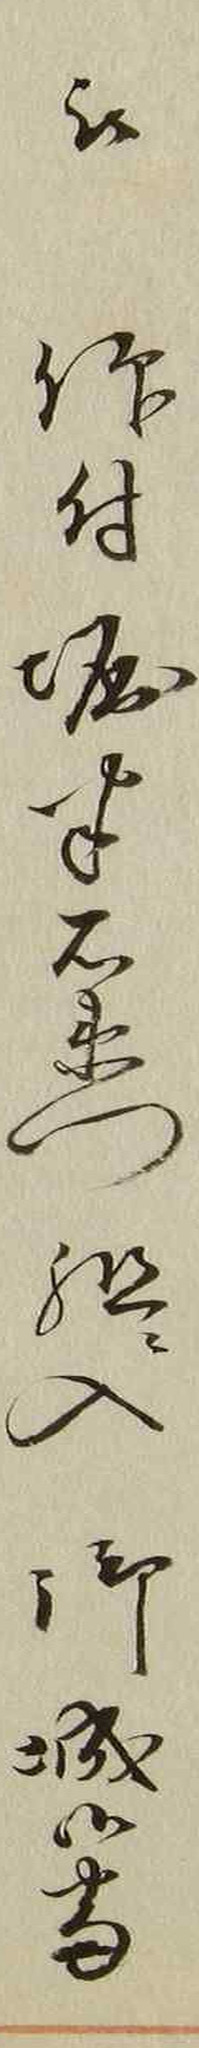被仰付堀半右衛門組ニ入御城御番
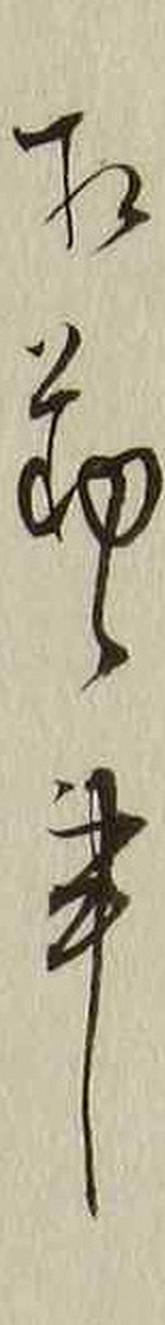相勤候事
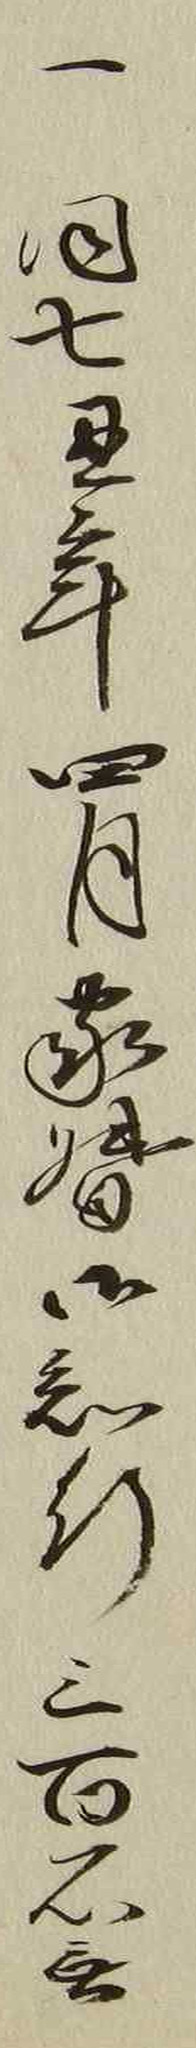一同七丑年四月家督御知行三百石無
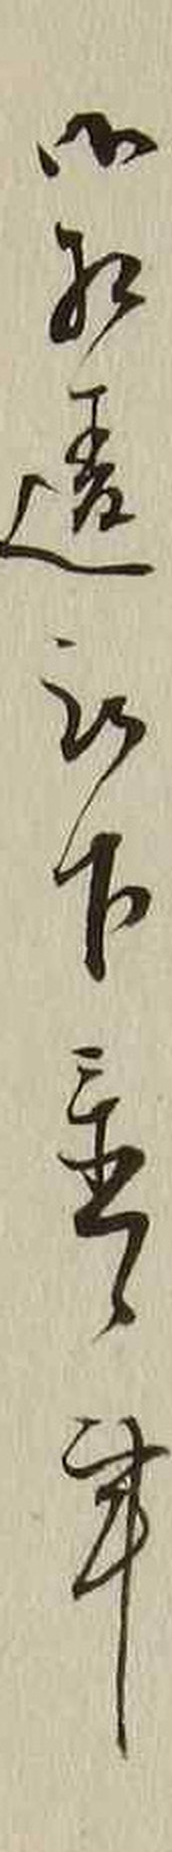御相違被下置候事
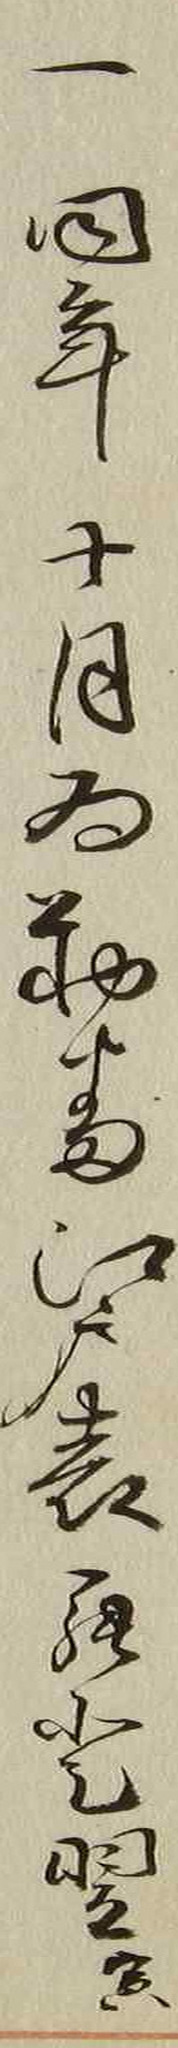一同年十月為勤番江戸表罷登翌寅
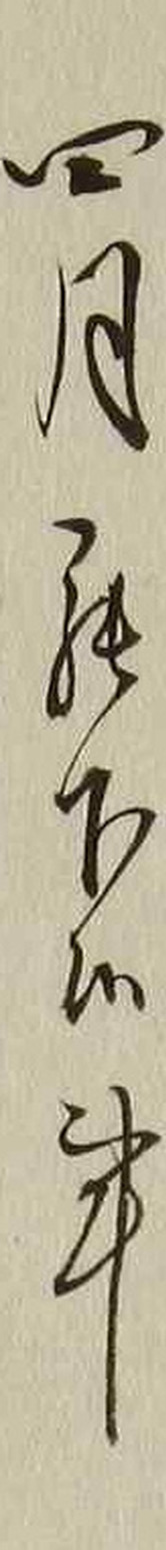四月罷下候事
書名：諸士系譜　巻之122　よ之部5
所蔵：会津若松市立会津図書館
